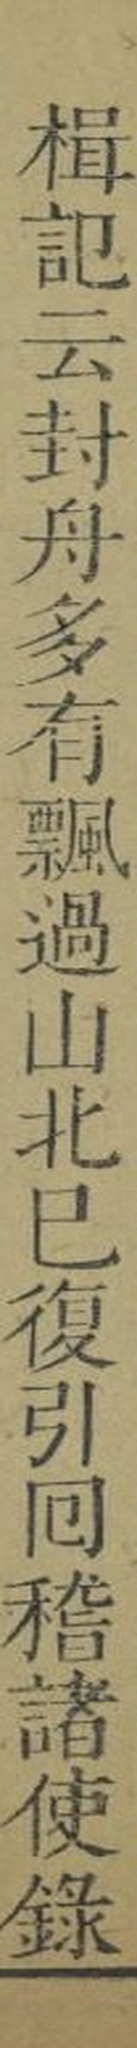楫記云封舟多有飄過山北巳復引囘稽諸使錄
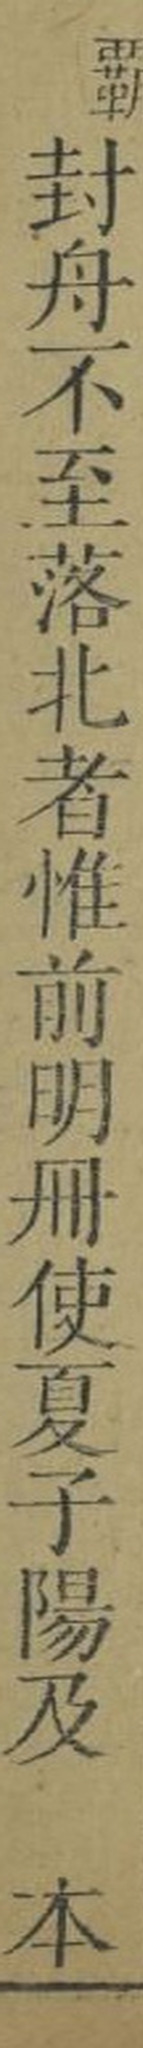覇封舟不至落北者惟前明冊使夏子陽及本
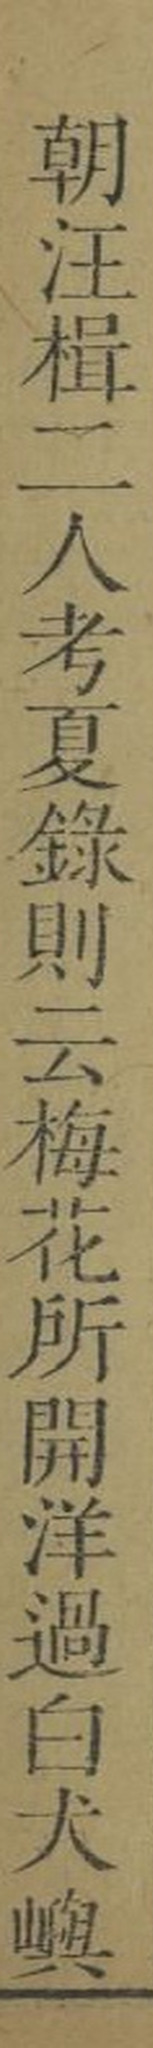朝汪楫二人考夏錄則云梅花所開洋過白犬嶼

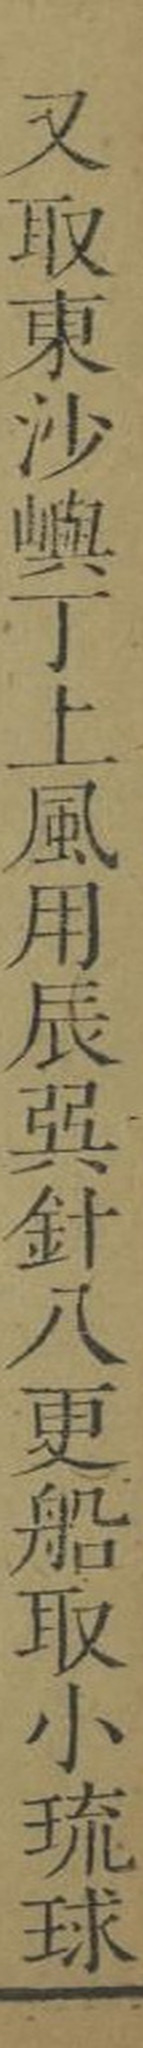又取東沙嶼丁上風用辰㢲針八更船取小琉球
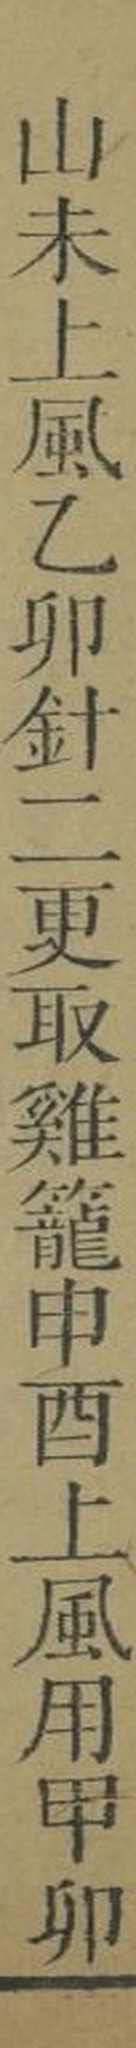山未上風乙卯針二更取雞籠申酉上風用甲卯
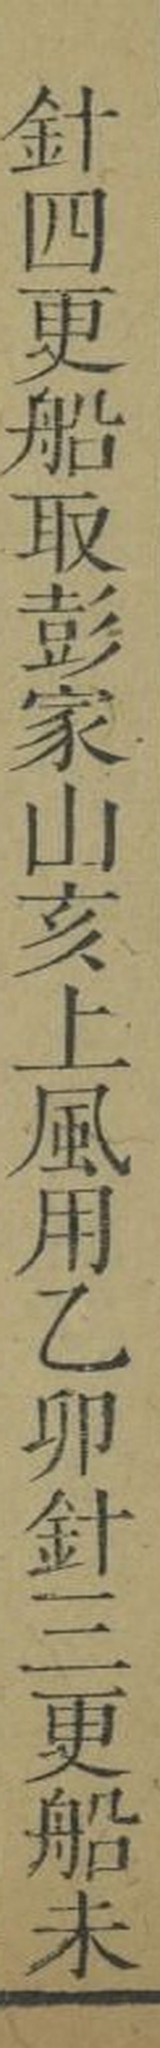針四更船取彭家山亥上風用乙卯針三更船未
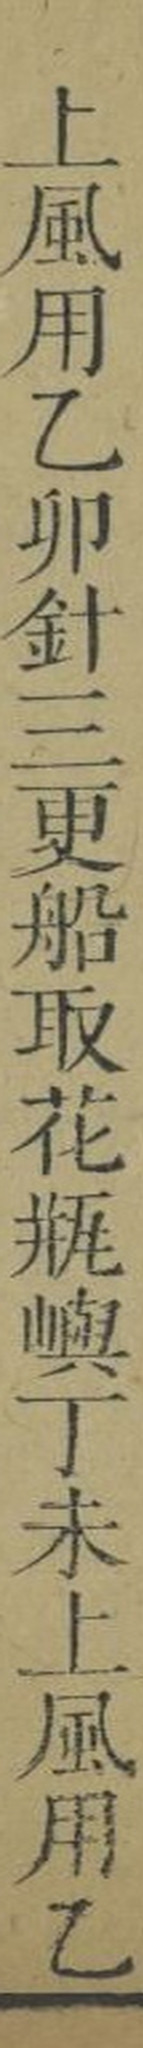上風用乙卯針三更船取花瓶嶼丁未上風用乙
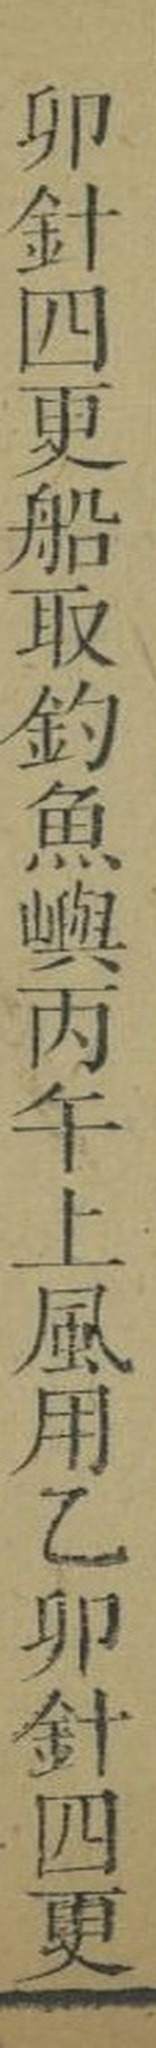卯針四更船取釣魚嶼丙午上風用乙卯針四更
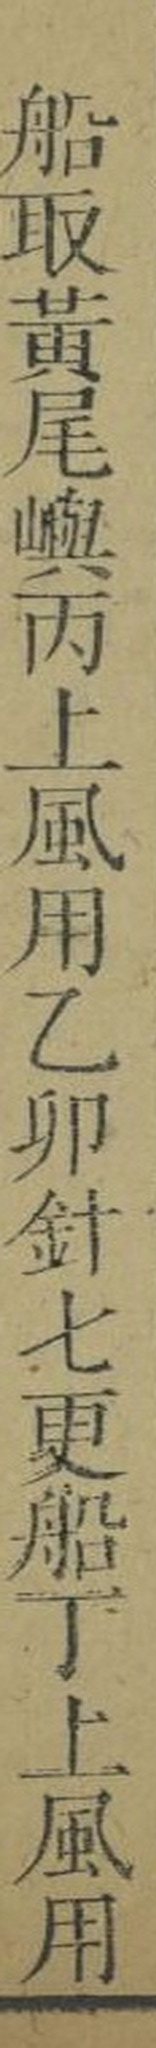船取黃尾嶼丙上風用乙卯針七更船丁上風用
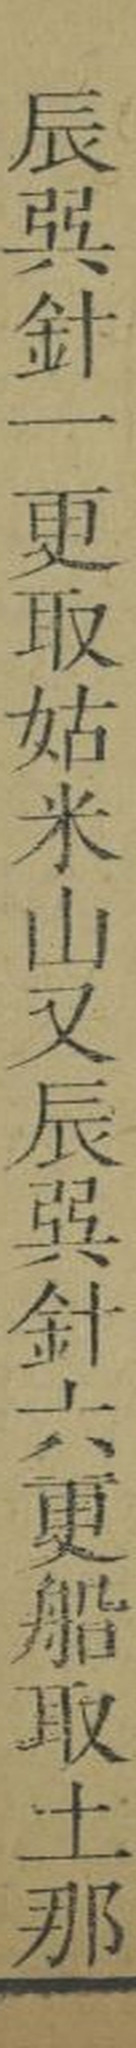辰㢲針一更取姑米山又辰㢲針六更船取土那
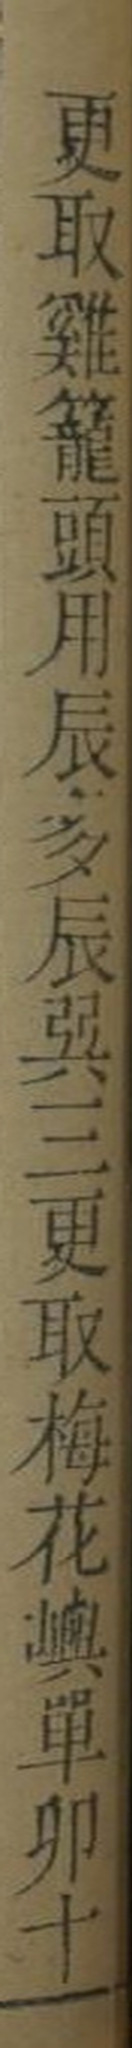更取雞籠頭用辰多辰㢲三更取梅花嶼單卯十
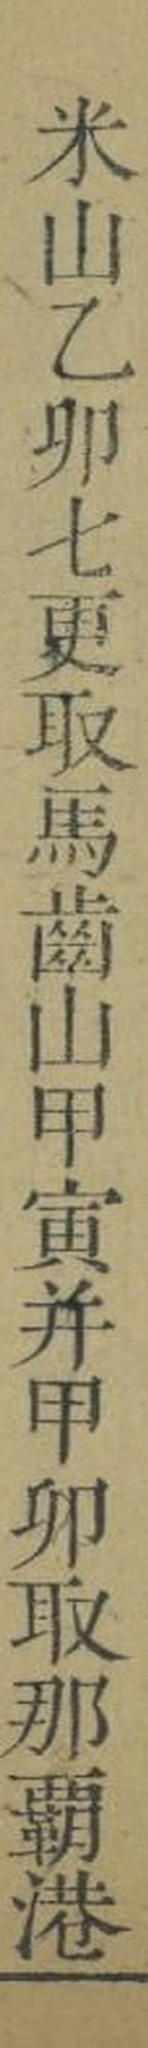米山乙卯七更取馬齒山甲寅并甲卯取那覇港
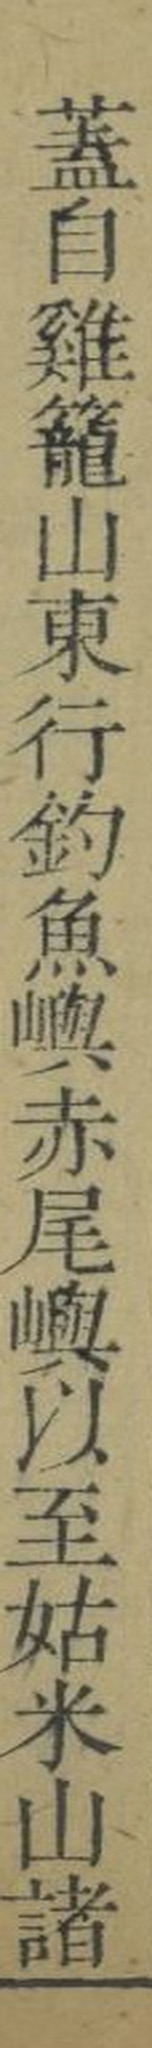蓋自雞籠山東行釣魚嶼赤尾嶼以至姑米山諸
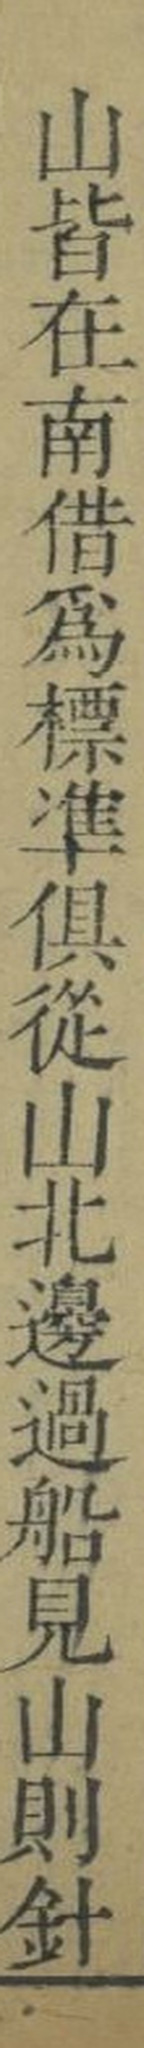山皆在南借爲標準俱從山北邊過船見山則針
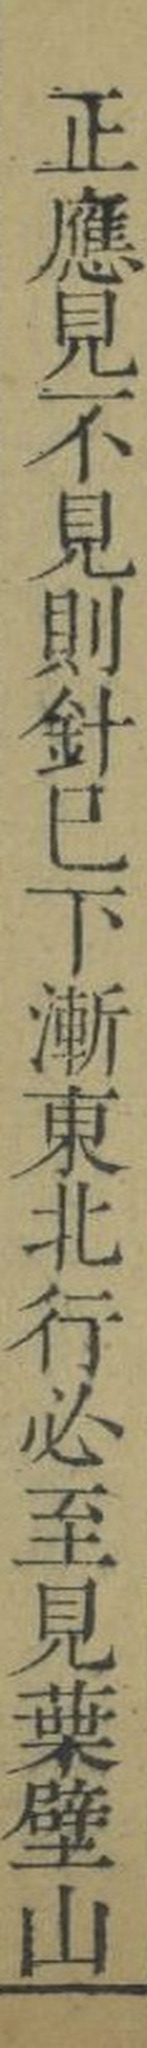正應見不見則針巳下漸東北行必至見葉壁山
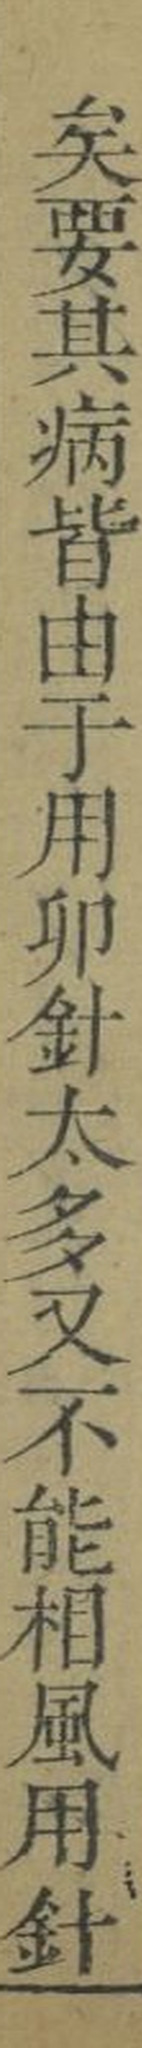矣要其病皆由于用卯針太多又不能相風用針
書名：中山伝信録 巻一
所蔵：University of the Ryukyus Library
